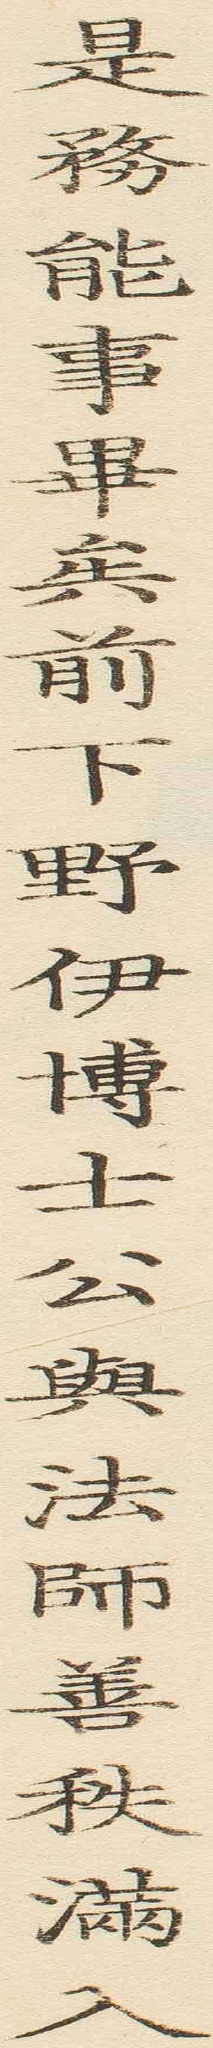是務能事畢矣前下野伊博士公與法師善秩滿入
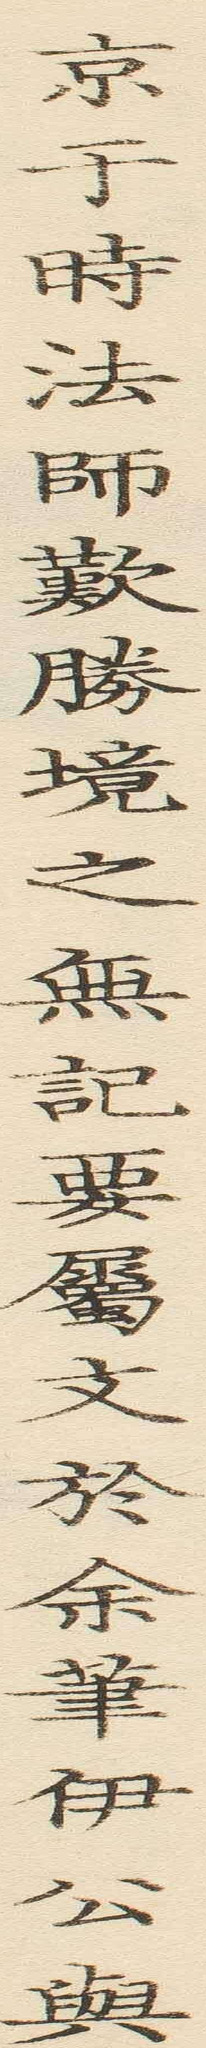京于時法師歎勝境之無記要屬文於余茟伊公與
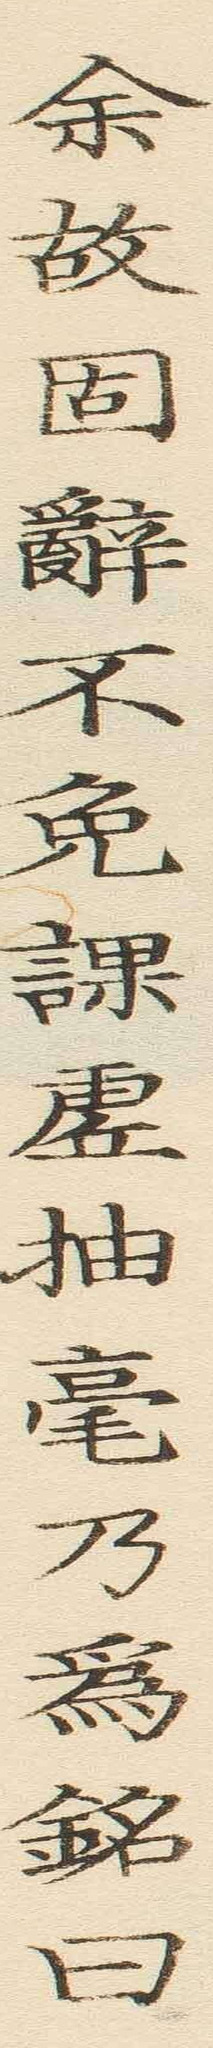余故固辭不免課虗抽毫乃爲銘曰
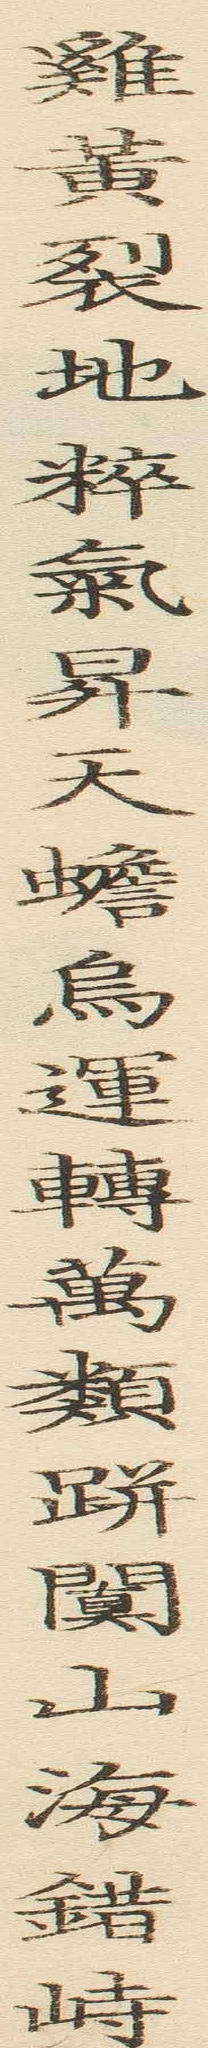鷄黄裂地粹氣昇天蟾烏運轉萬類跰闐山海錯峙
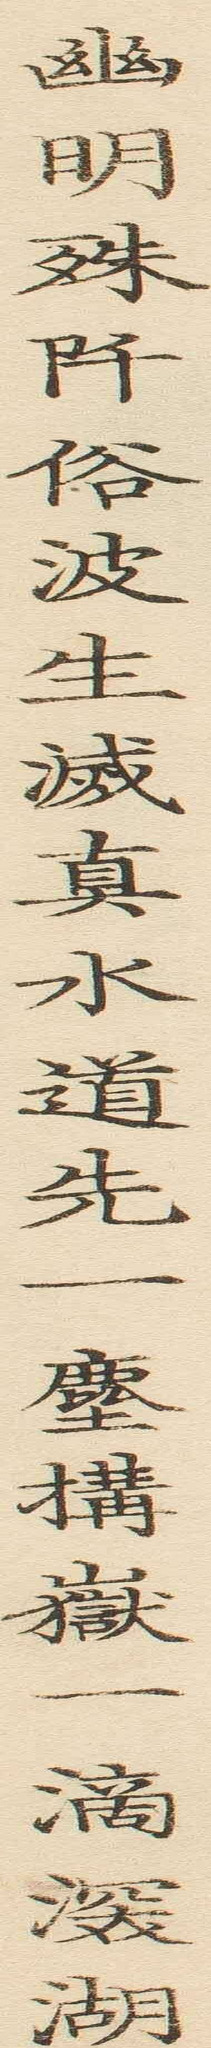幽明殊阡俗波生滅真水道先一塵搆嶽一滴㴱湖
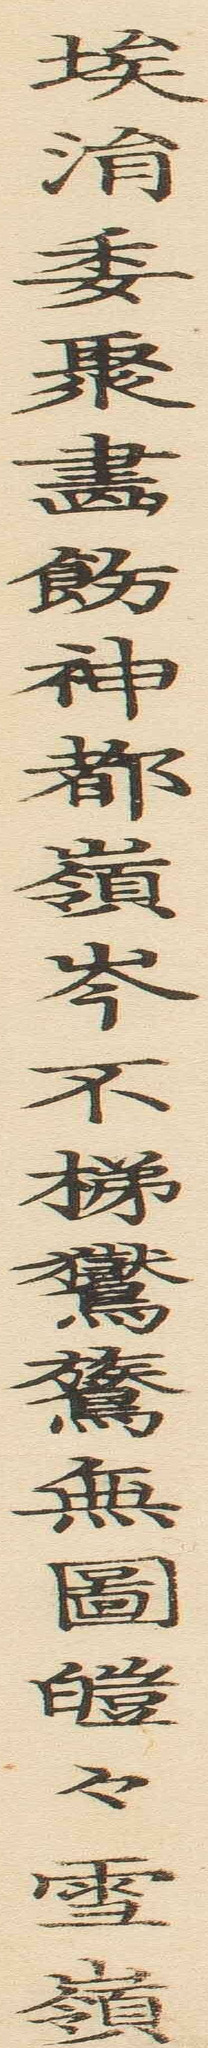埃㳙委聚畵飭神都嶺岑不梯鸑鷟無圖皚々雪嶺

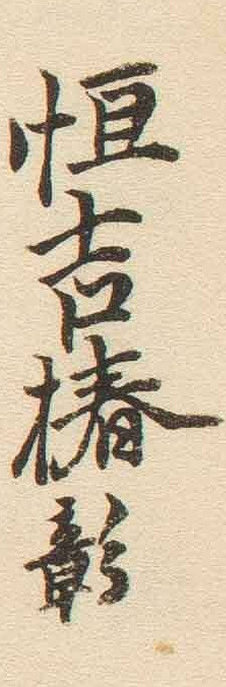恒吉椿彰
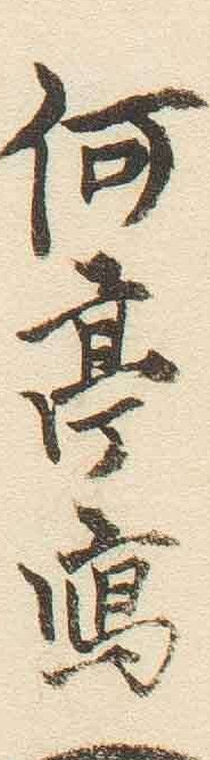何亭寫
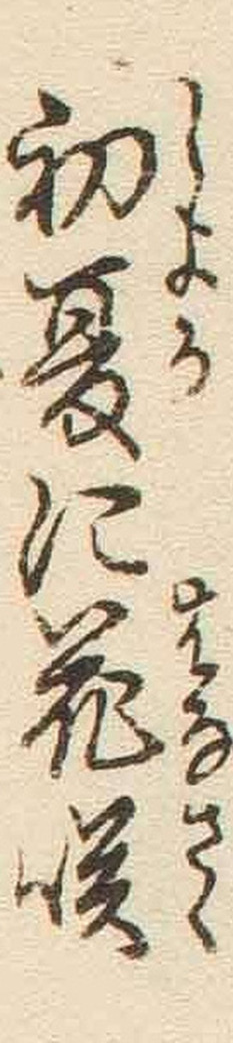初夏に花咲
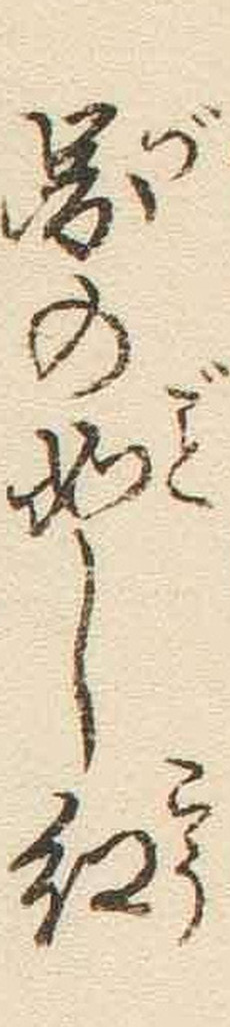圖の如し紅
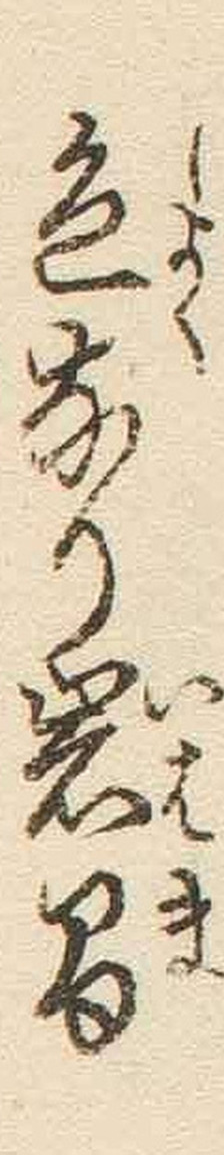色なり岩間
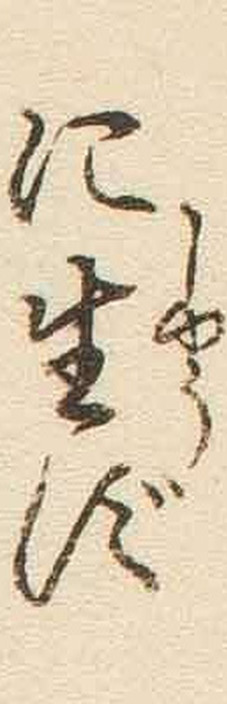に生ず
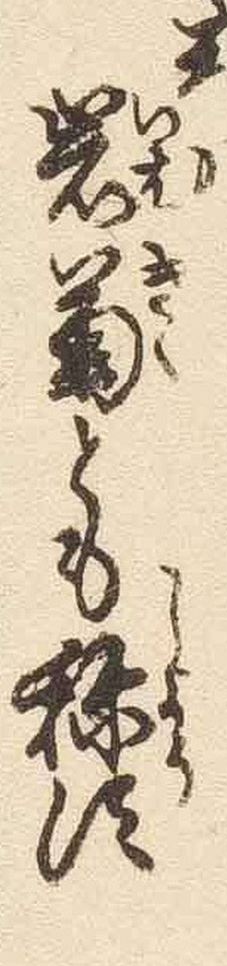岩菊とも称す
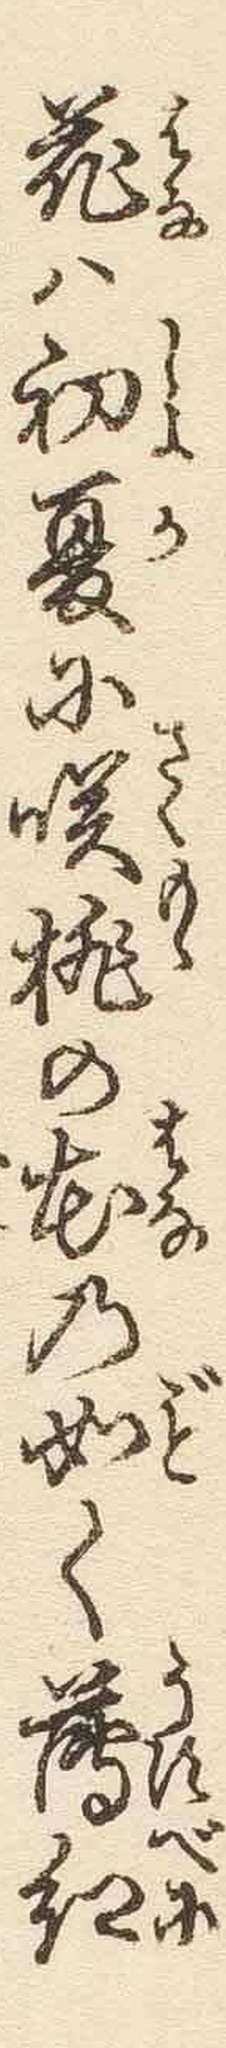花は初夏に咲桃の花の如く薄紅
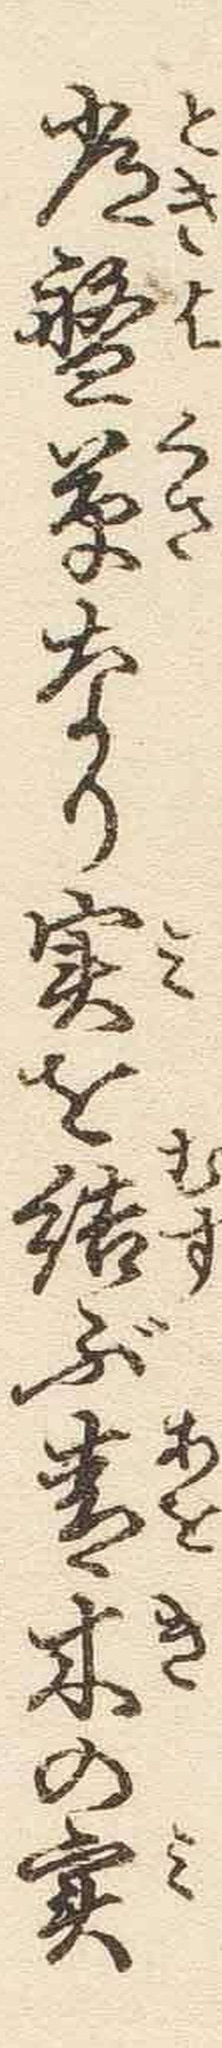常盤草なり実を結ぶ青木の実
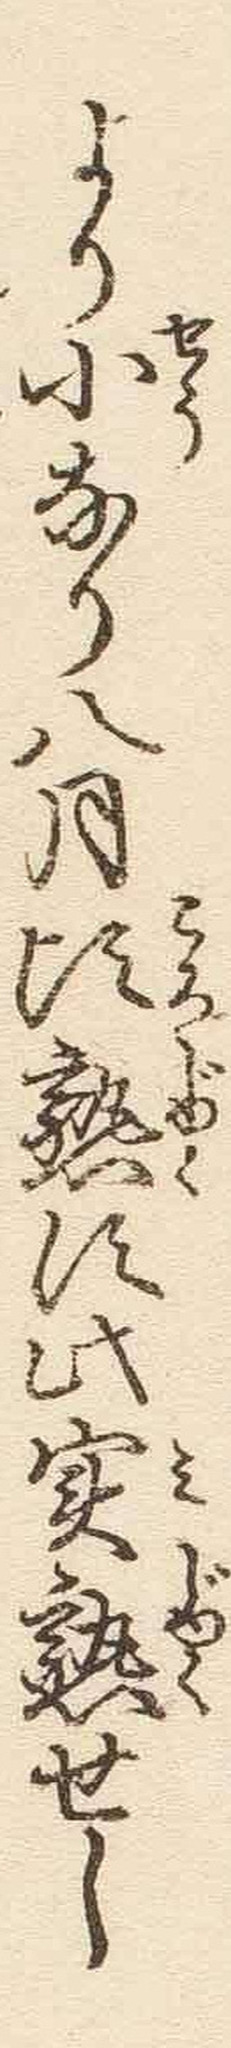より小なり八月頃熟す此実熟せし
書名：日光山志
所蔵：東京学芸大学附属図書館 国文学研究資料館
